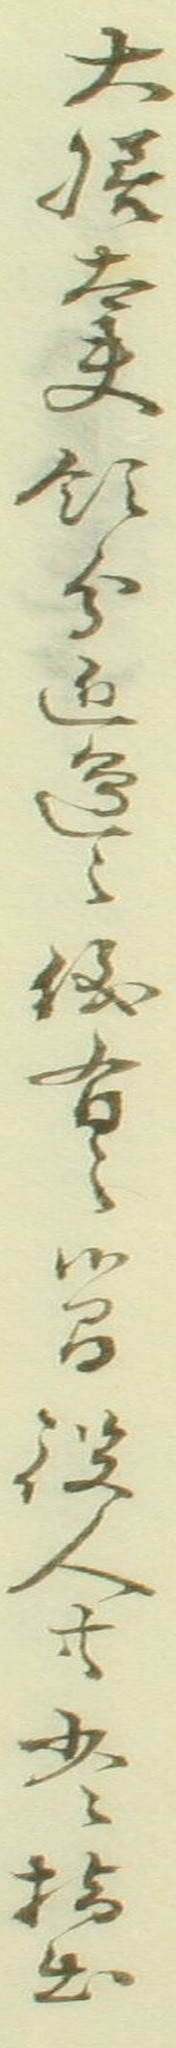大膳太夫領分近辺之儀有之候間役人共少々指出
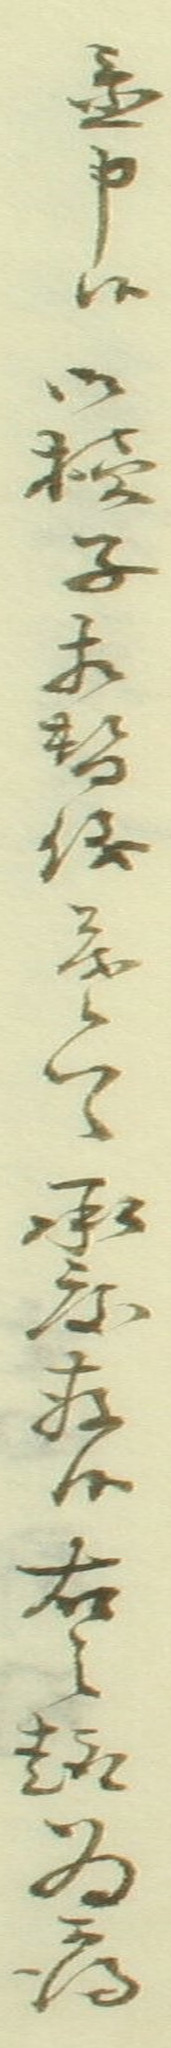置申候御様子相替儀茂候はゝ承度存候右之趣為可得
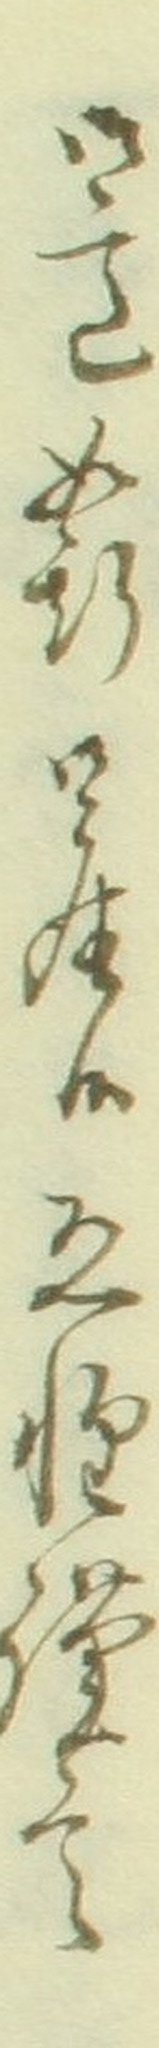御意如斯御座候恐惶謹言
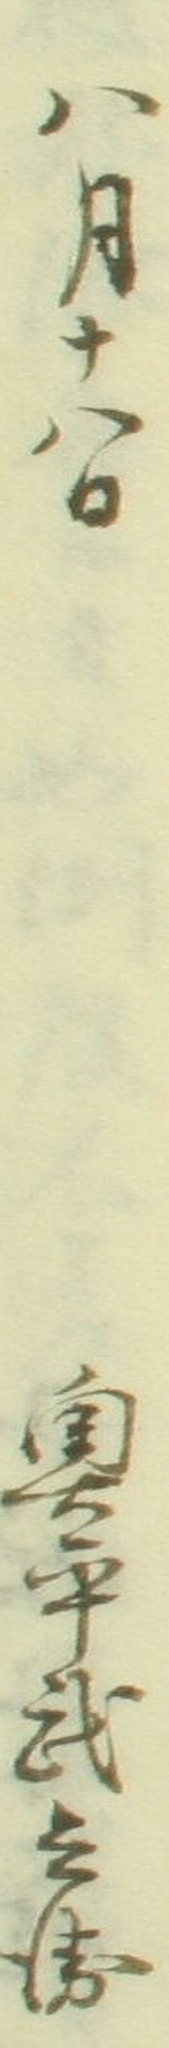八月十八日奥平武兵衛

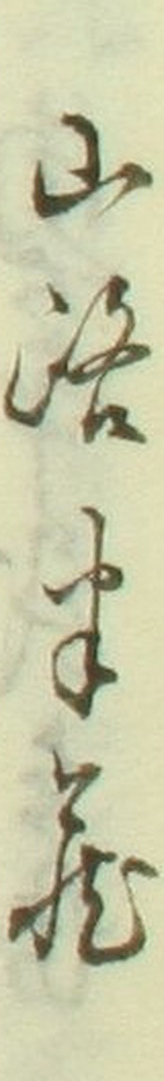山路半蔵
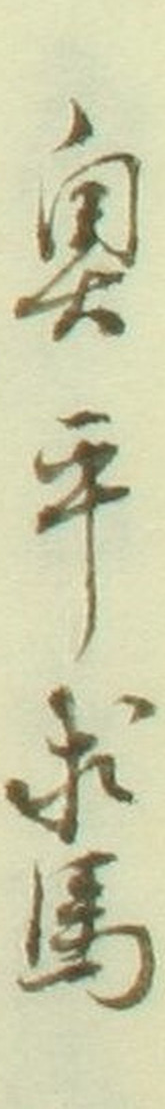奥平求馬
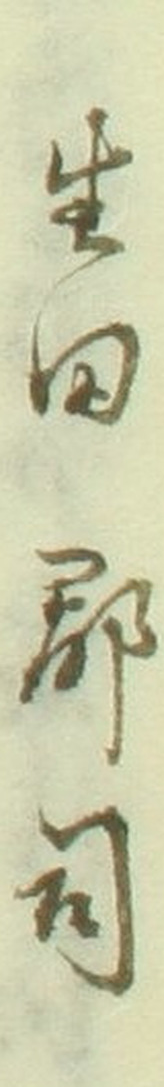生田郡司
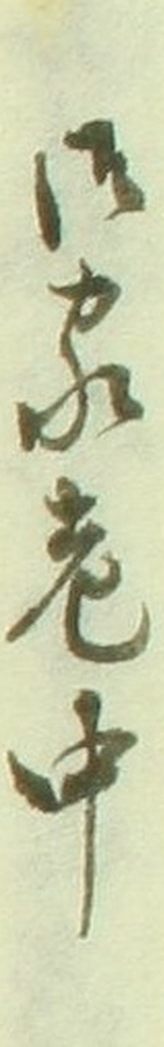御家老中
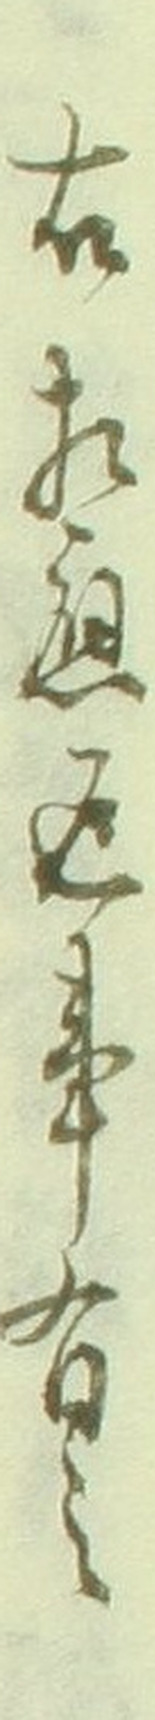右相応返事有之
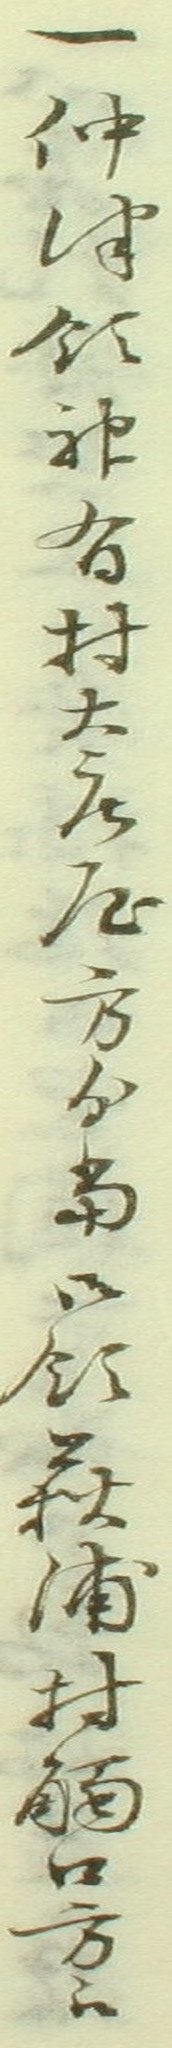一仲津領神有村大庄屋方ゟ当御御領萩浦村触口方え
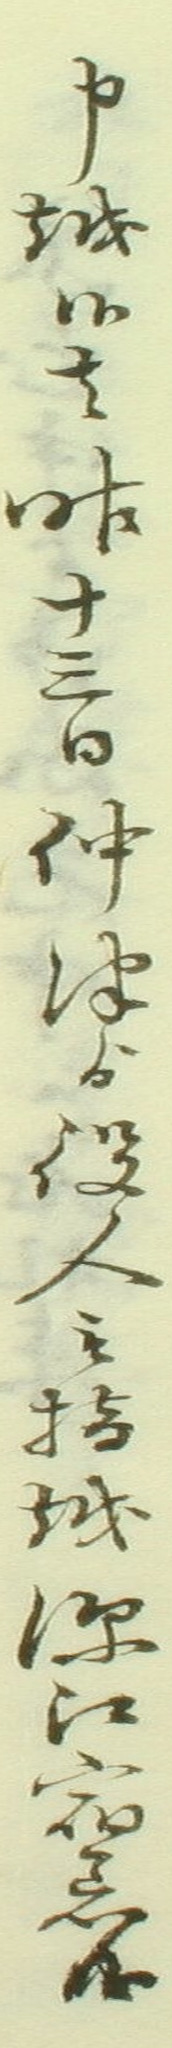申越候は昨十三日仲津ゟ役人被指越深江宿着候
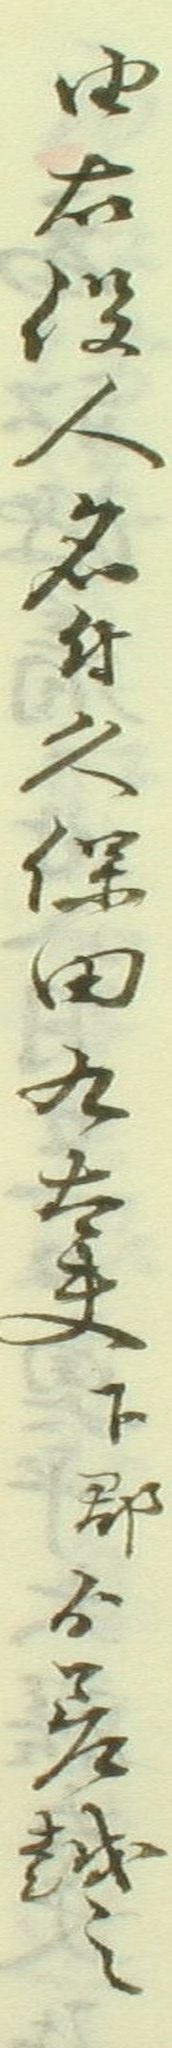由右役人名付久保田九太夫下郡ゟ差越之
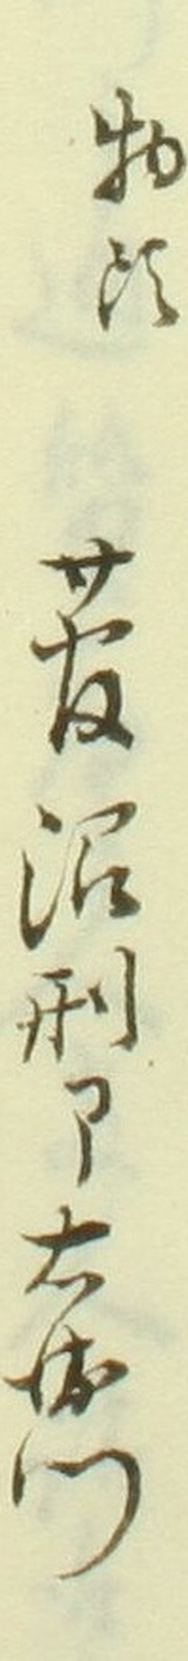物頭菅沼刑部右衛門
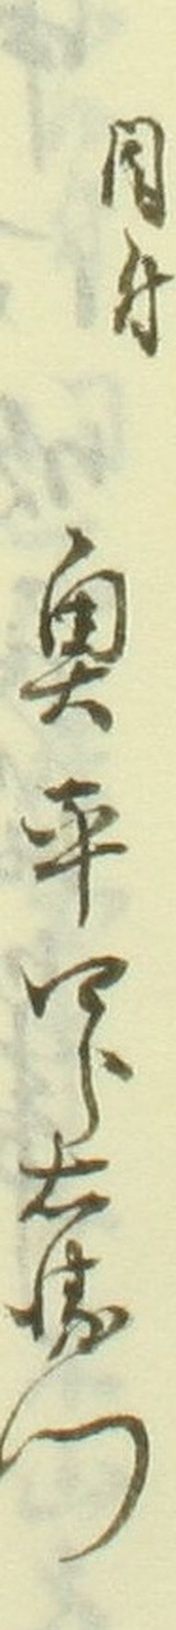目付奥平四郎右衛門
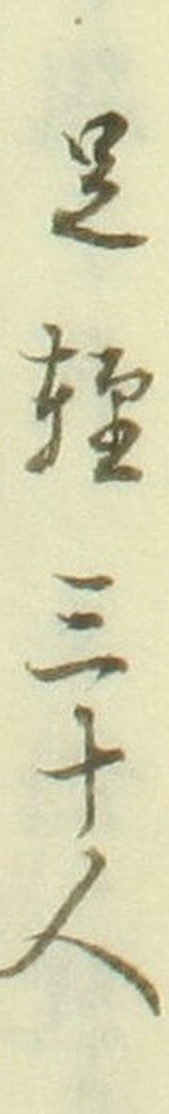足軽三十人
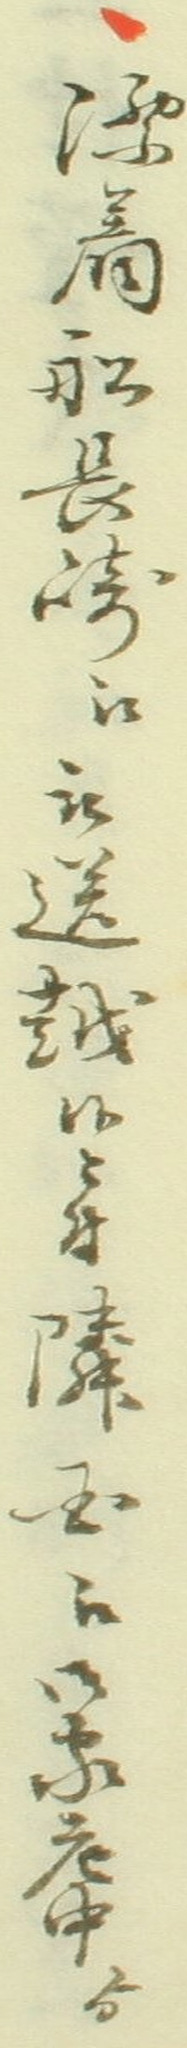漂着船長長崎え被送越候に付隣国え御家老中ゟ
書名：異国船漂着記
